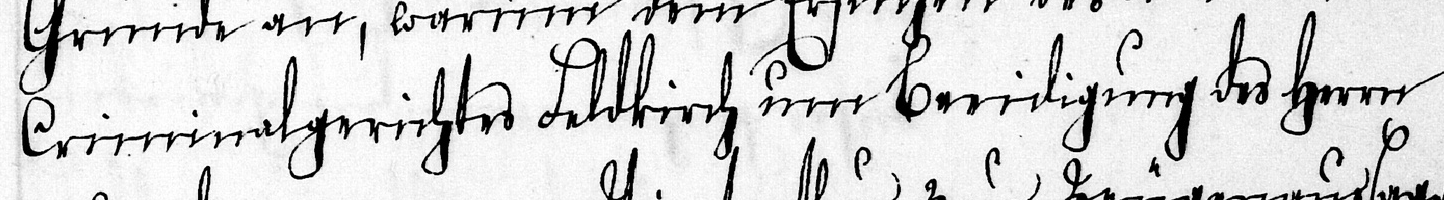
Criminalgerichtes Feldkirch um Beeidigung des Herrn
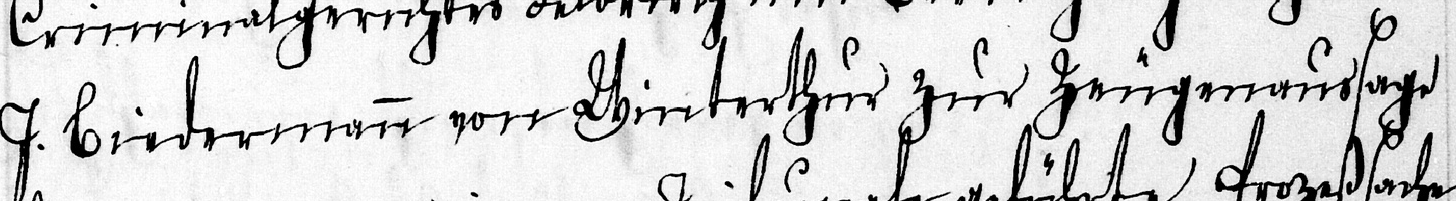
J. Biedermann von Winterthur zur Zeugenaussage
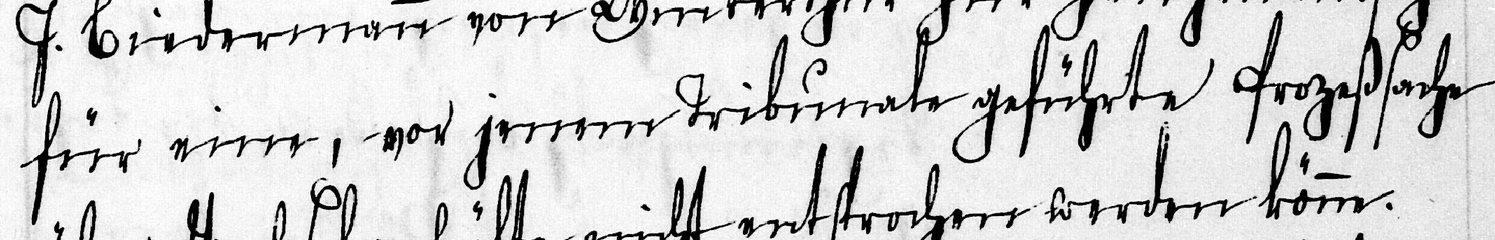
für eine, vor jenem Tribunale geführte Prozeßsache
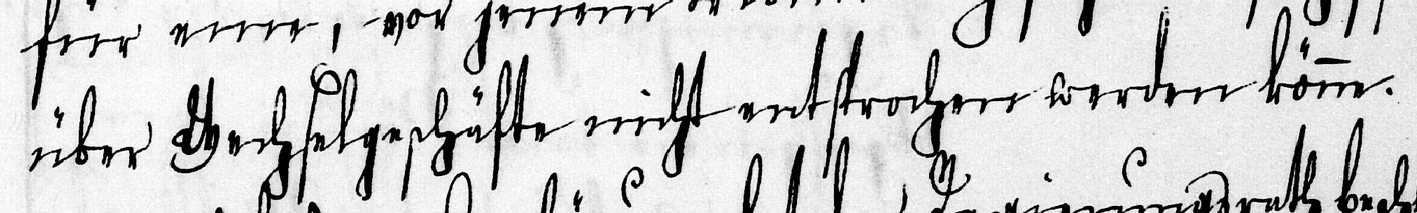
über Wechselgeschäfte nicht entsprochen werden könne.
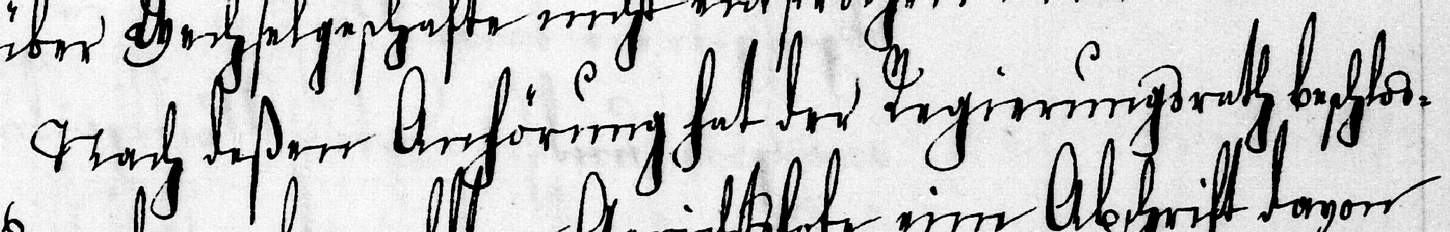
Nach deßen Anhörung hat der Regierungsrath beschloß¬
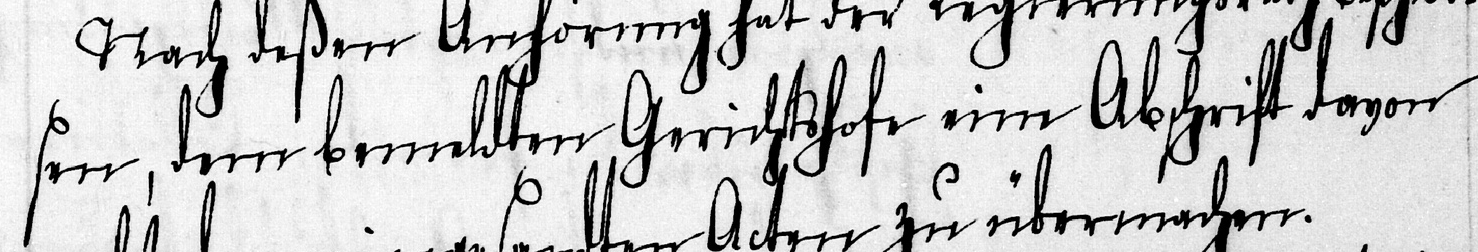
en, dem bemeldten Gerichtshofe eine Abschrift davon
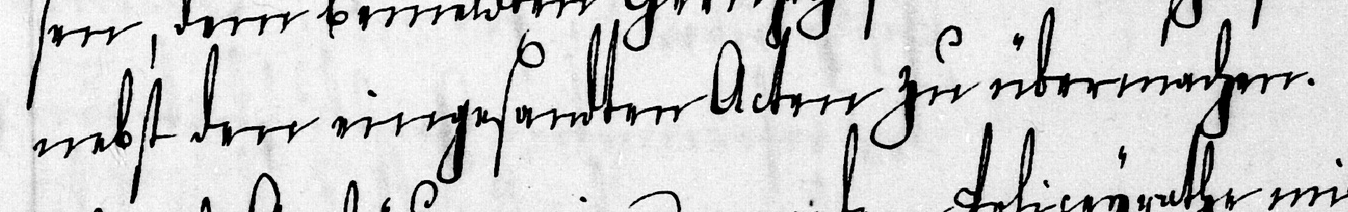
nebst den eingesandten Acten zu übermachen.
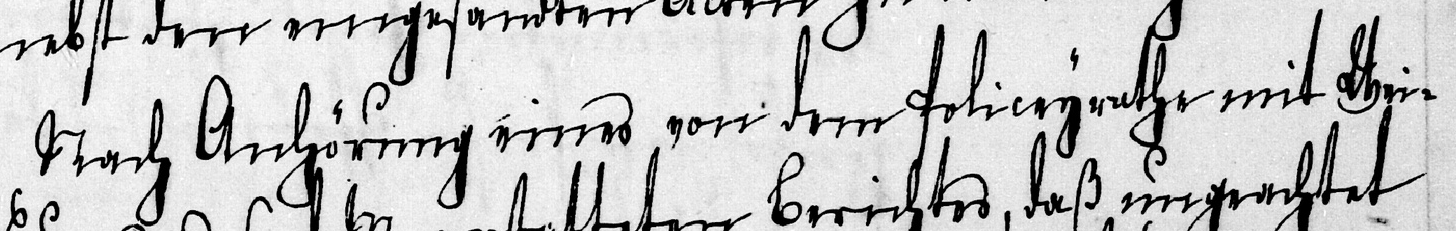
Nach Anhörung eines von dem Policeyrathe mit Weis¬
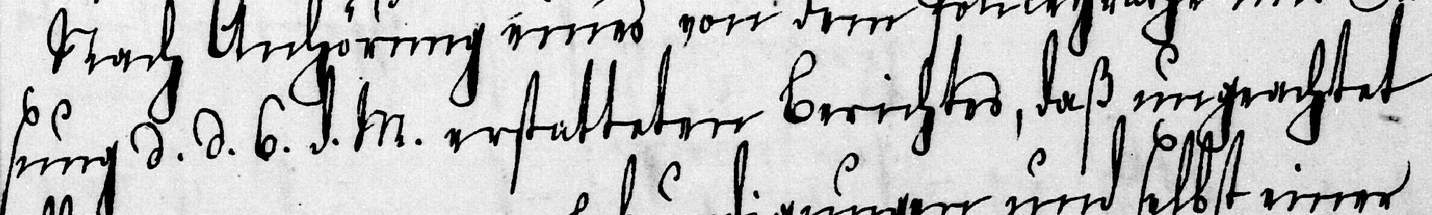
ung d. d. 6. d. M. erstatteten Berichtes, daß ungeachtet
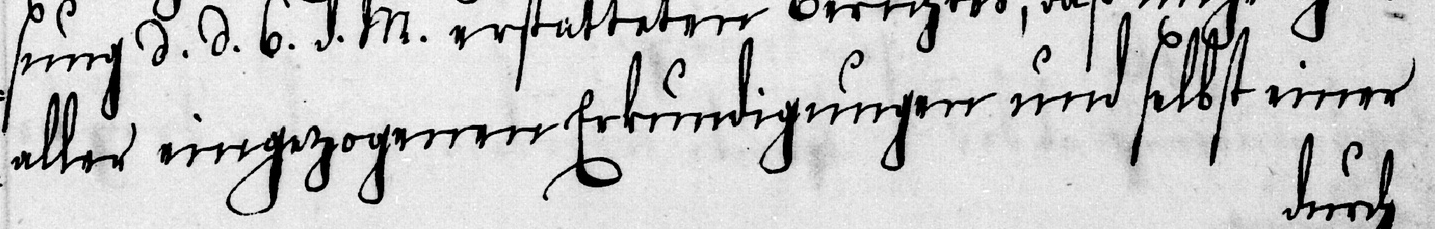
ller eingezogenen Erkundigungen und selbst einer
